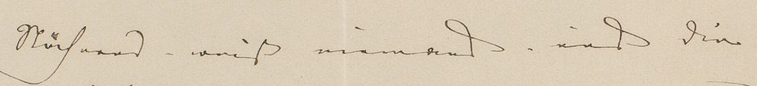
Näheres – weiß niemand – und die
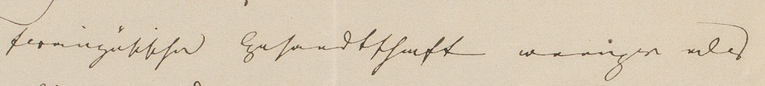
französische Gesandtschaft weniger als
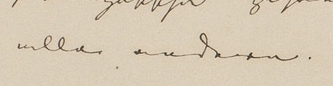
alle andern.
